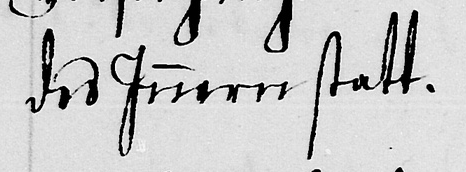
des Innern statt.
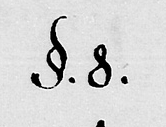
§. 8.
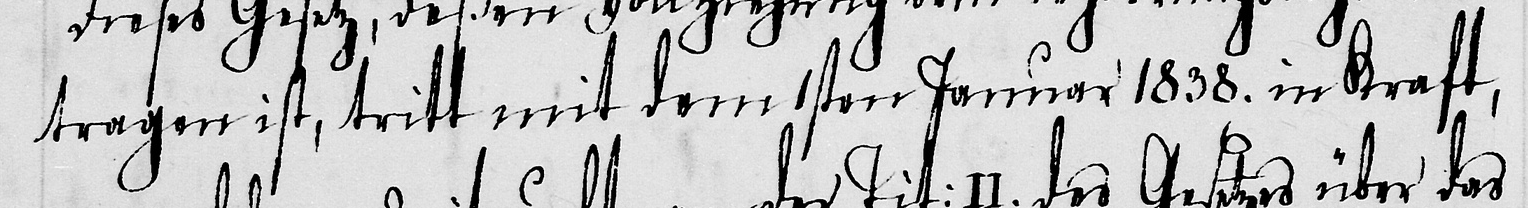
tragen ist, tritt mit dem 1sten Januar 1838. in Kraft,
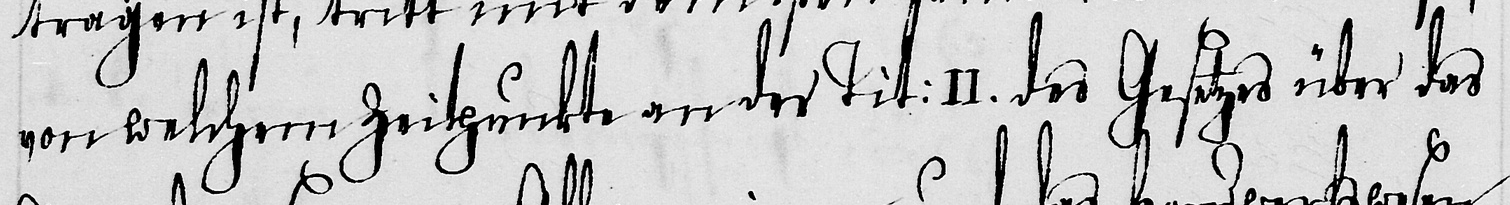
von welchem Zeitpunkte an der Tit: II. des Gesetzes über das
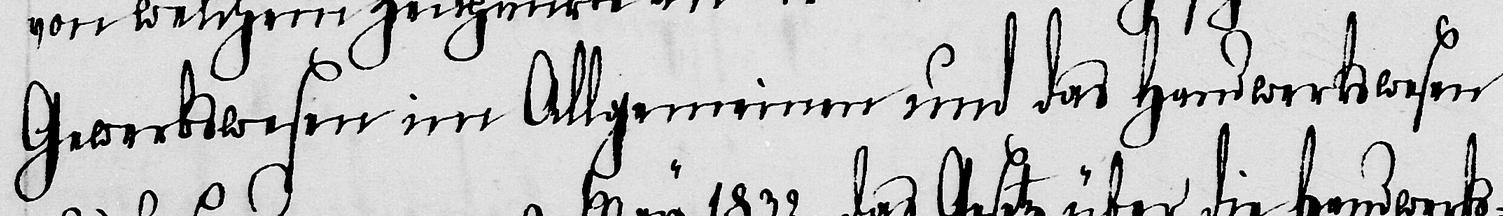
Gewerbswesen im Allgemeinen und das Handwerkswesen
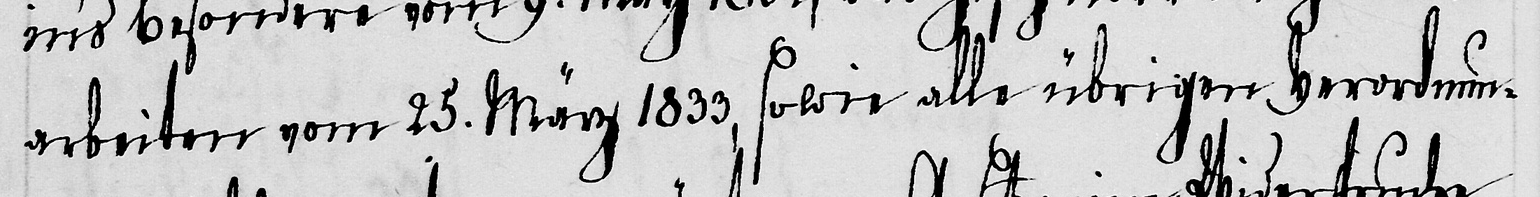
arbeiten vom 25. März 1833, sowie alle übrigen Verordnun¬
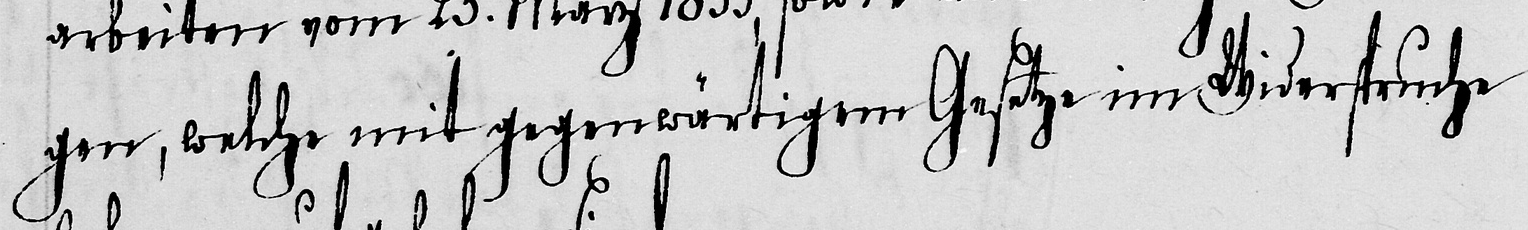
gen, welche mit gegenwärtigem Gesetze im Widerspruche
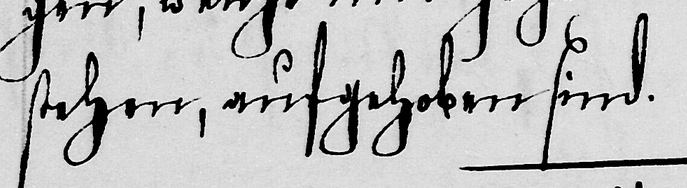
stehen, aufgehoben sind.
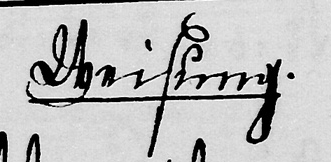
Weisung.
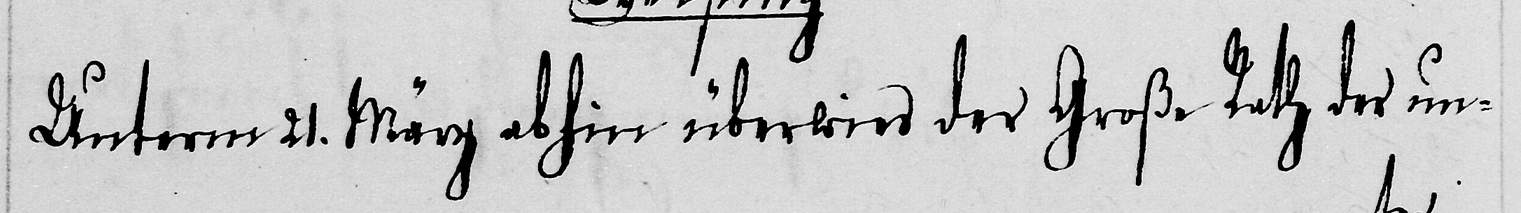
Unterm 21. May abhin überwies der Große Rath der un-
